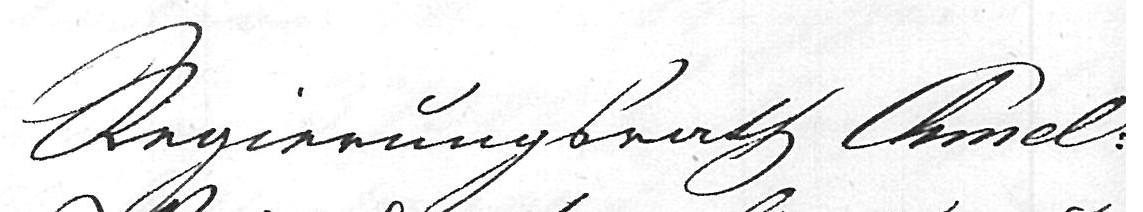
Regierungsrath Chmel:
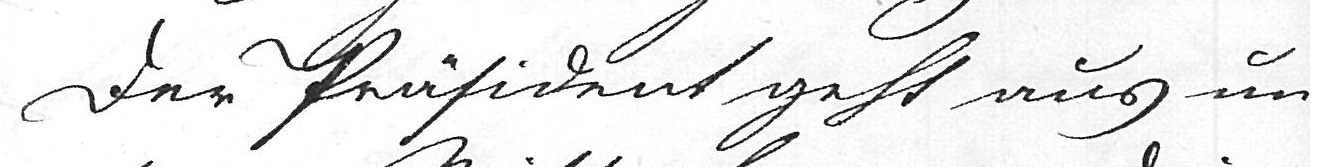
Der Präsident geht aus un-
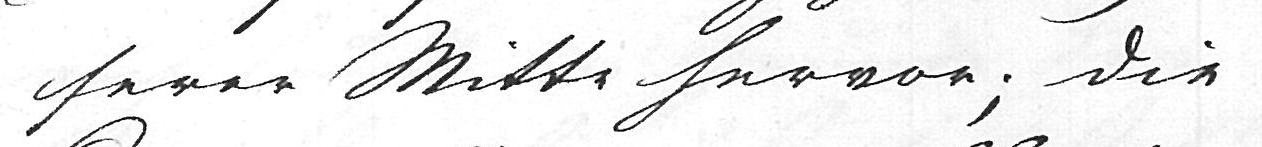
serner Mittel hervor; die
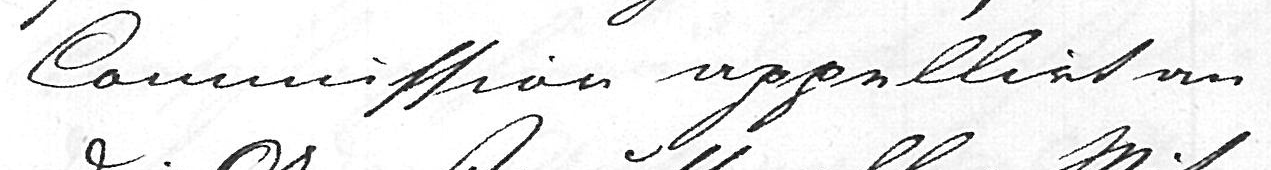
Commission appellirt an
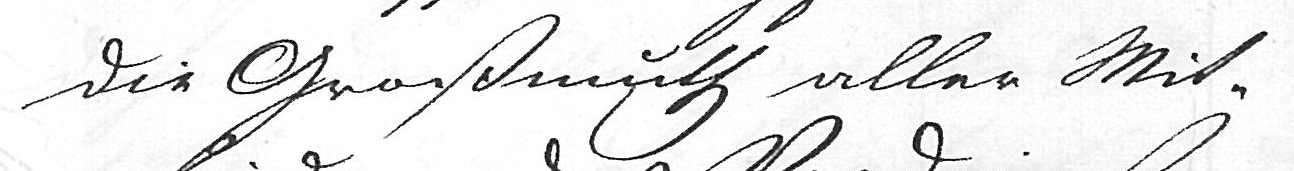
die Großmuth aller Mit-
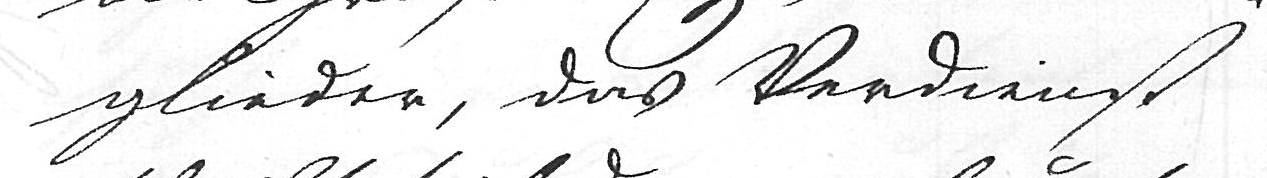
glieder, das Verdienst
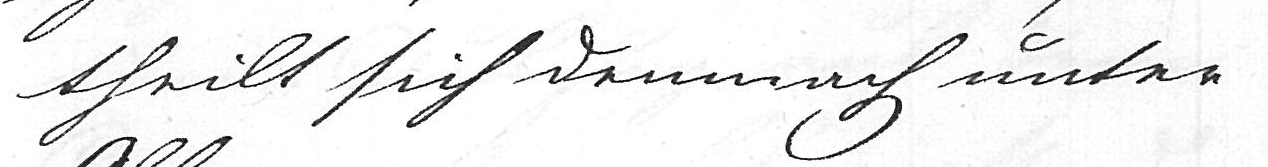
theilt sich demnach unter
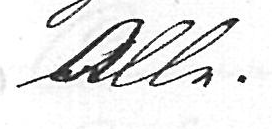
Alle.
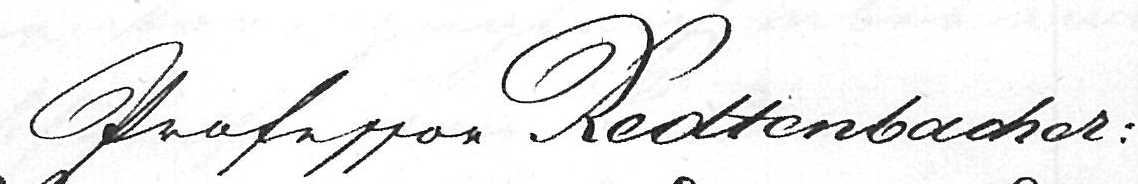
Professor Redtenbacher:
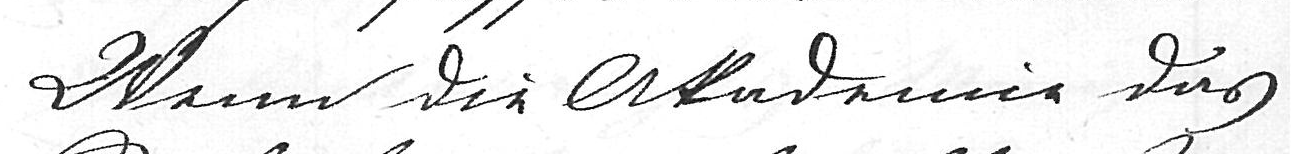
Wenn die Akademie das
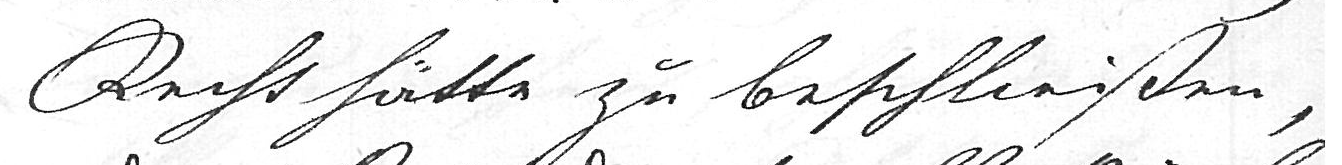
Recht hätte zu beschließen,
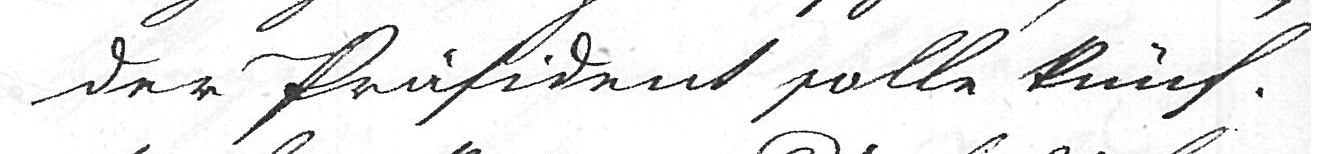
der Präsident solle künf-
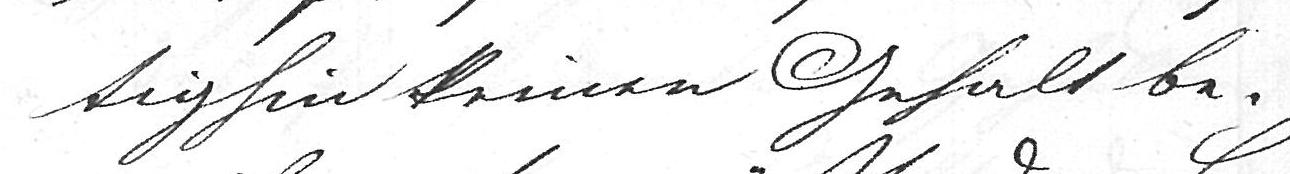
tighin keinen Gehalt be-
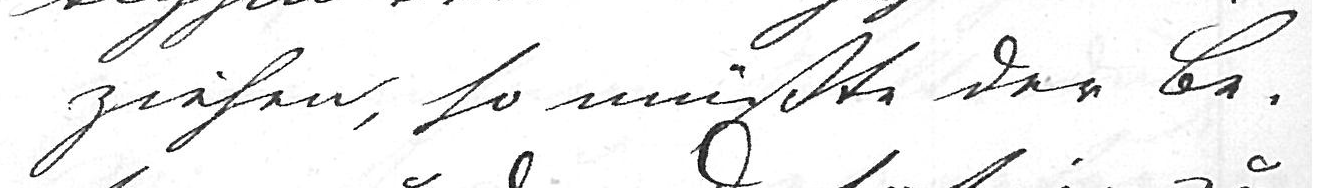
ziehen, so müßte der Be-
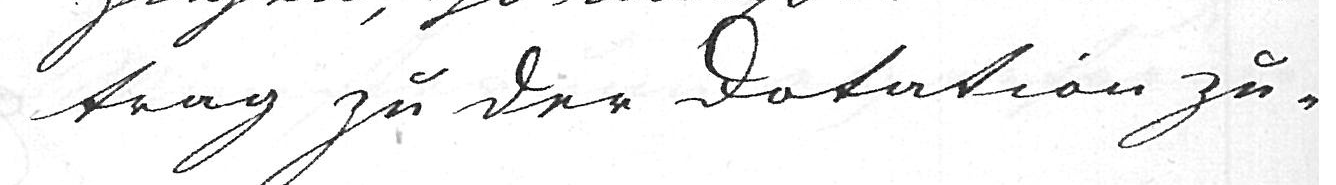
trag zu der Dotation zu-
